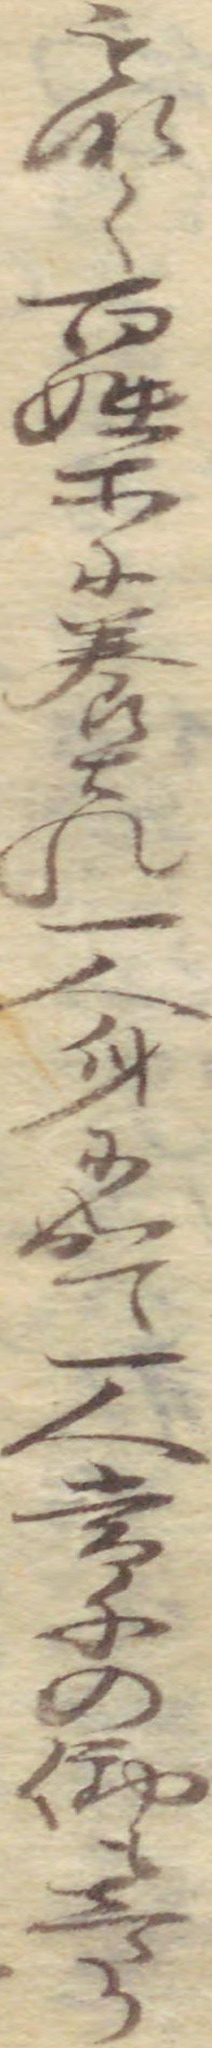もなく百姓等に養はれ一人身に成て一人当千の働もしたり
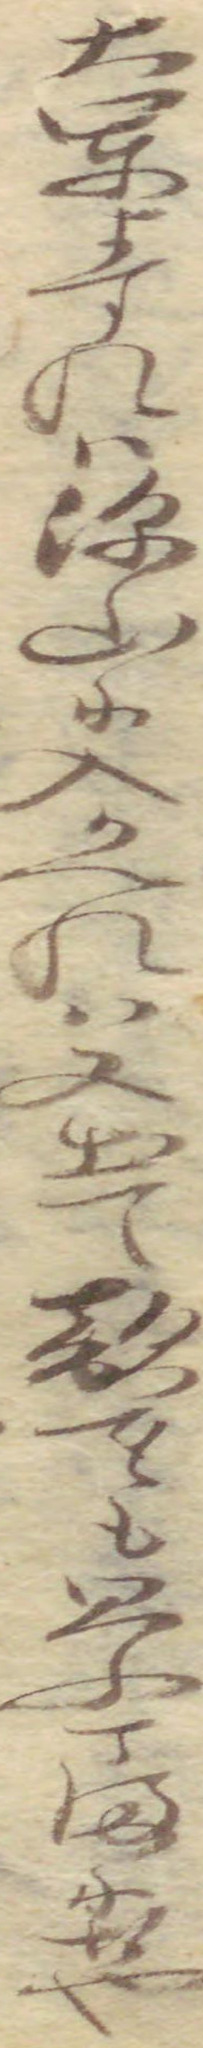大軍よすれは深山に入かへれは又出て敵をも思ふさまになや
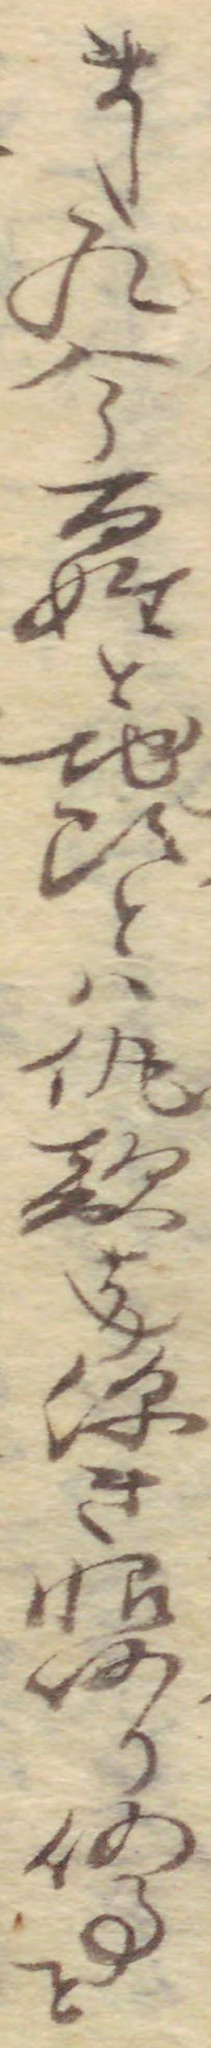ましたれ今百姓と地頭とは仇敵より深き恨あり何事そ
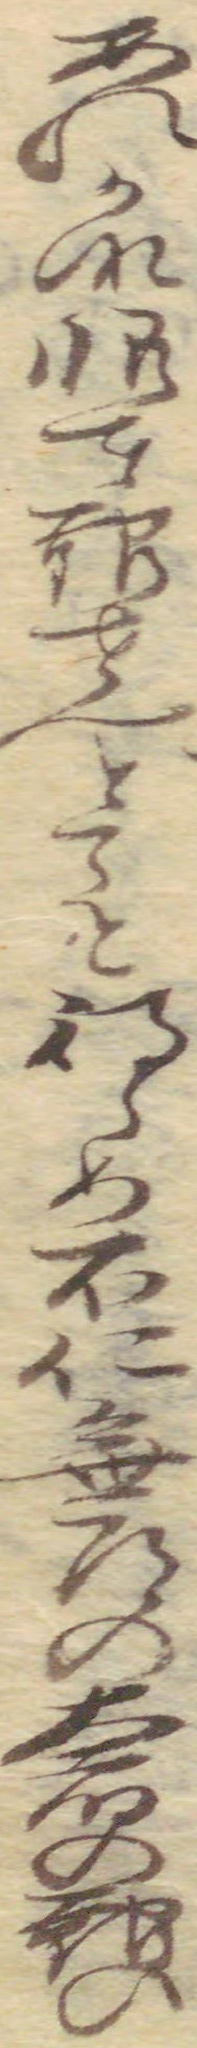あれかな恨を報せんとこそ待らめ不仁無道の奢の報ひ
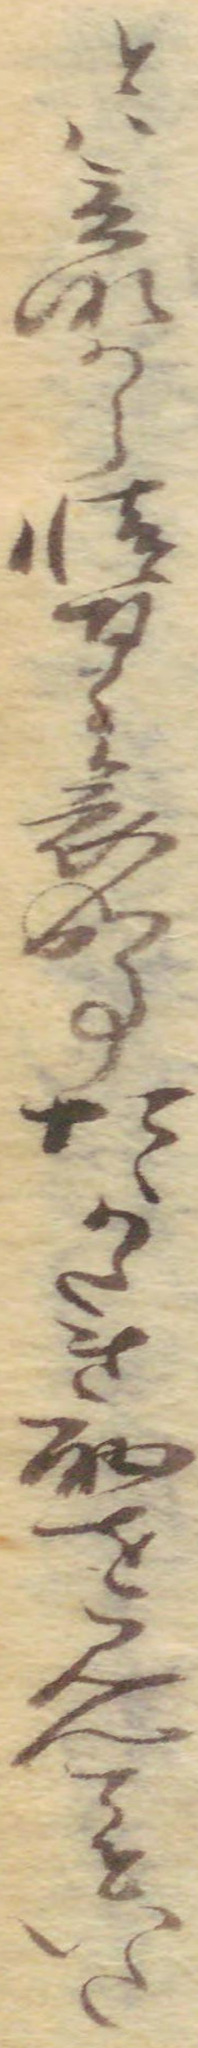とは言なから情なく哀成事たゝかたき恥を見んこそいた

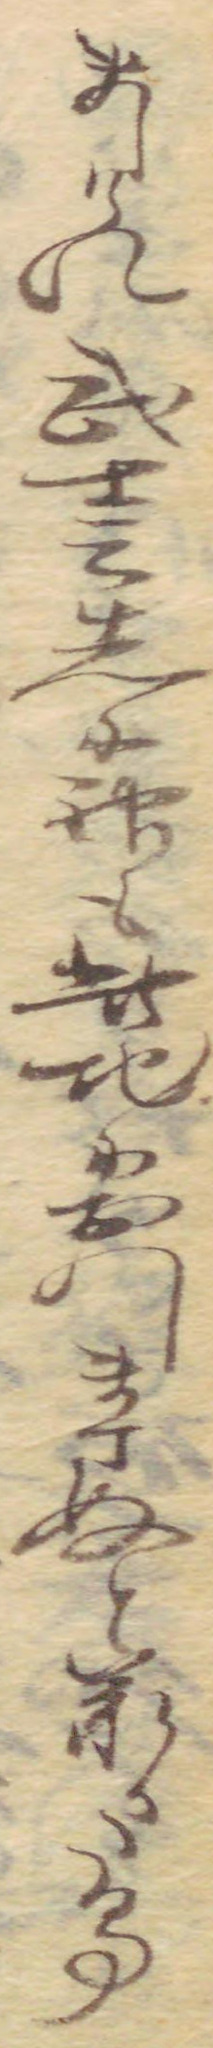ましけれ武士云先に神も此地におはしまさぬと承りたる事
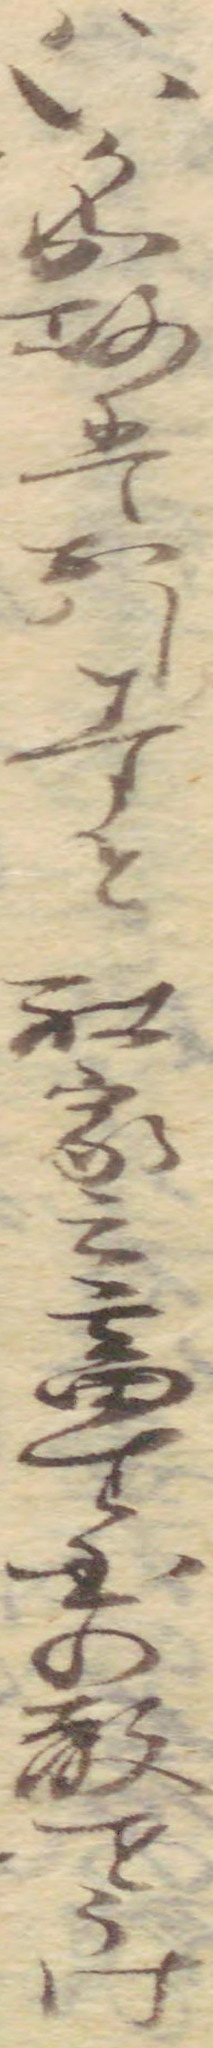はいか成故にておはしますそ社家云畜生国の教をうけ
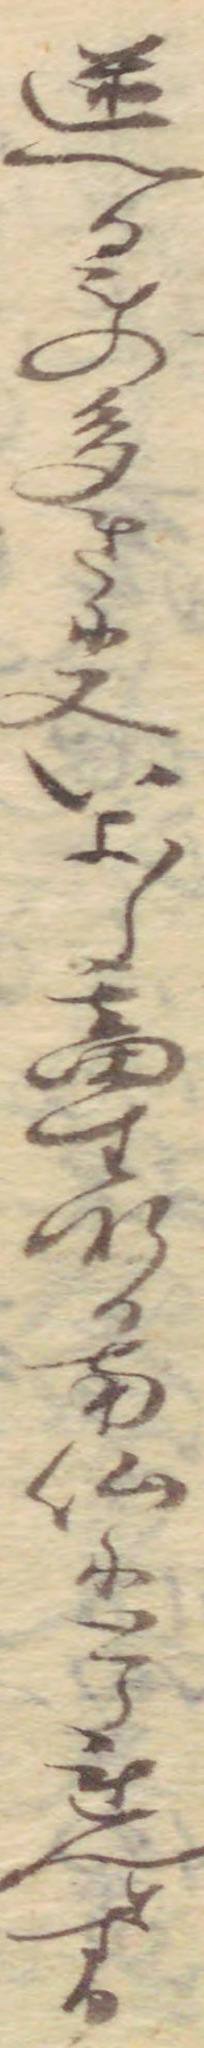迷へるもの多きに又いよ〳〵畜生なる南仏にとられんとする
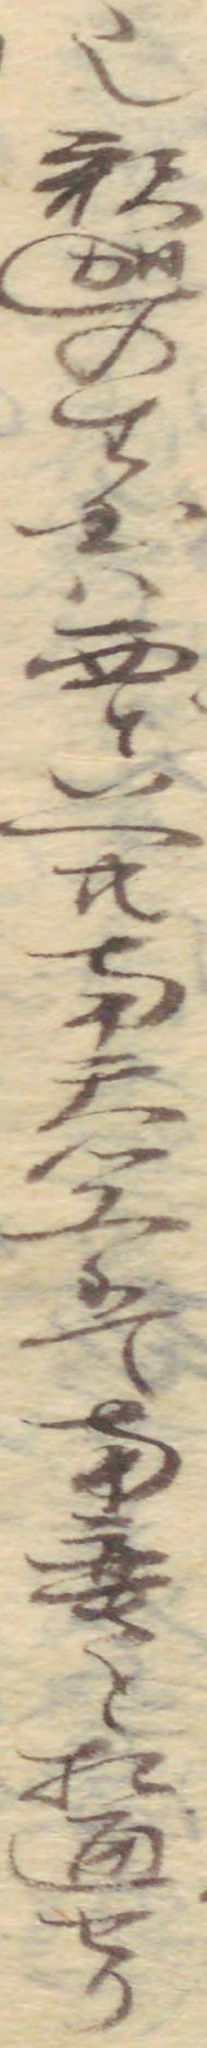也釈迦の生国は西といへ共南天竺にて南蛮と相通せり
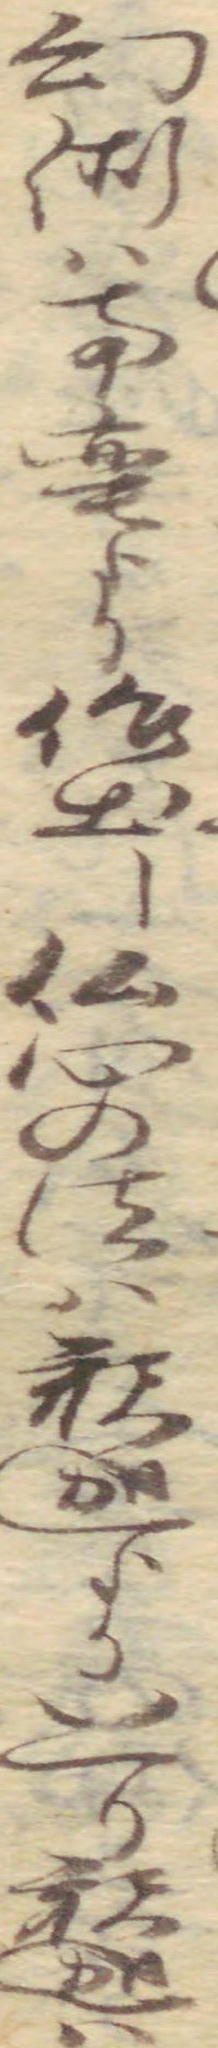幻術は南蛮より作出し仏心の法は釈迦よりいへり釈迦は
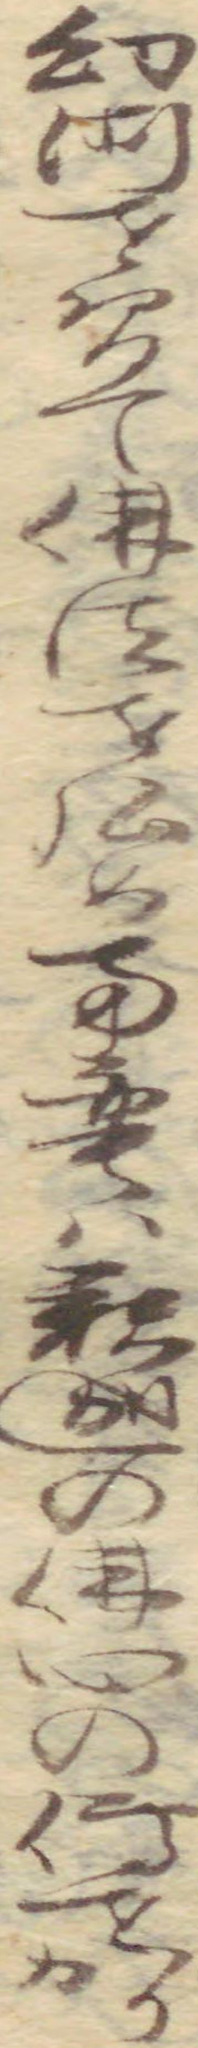妖術を習て仏法を弘め南蛮は釈迦の仏心の伝をかり
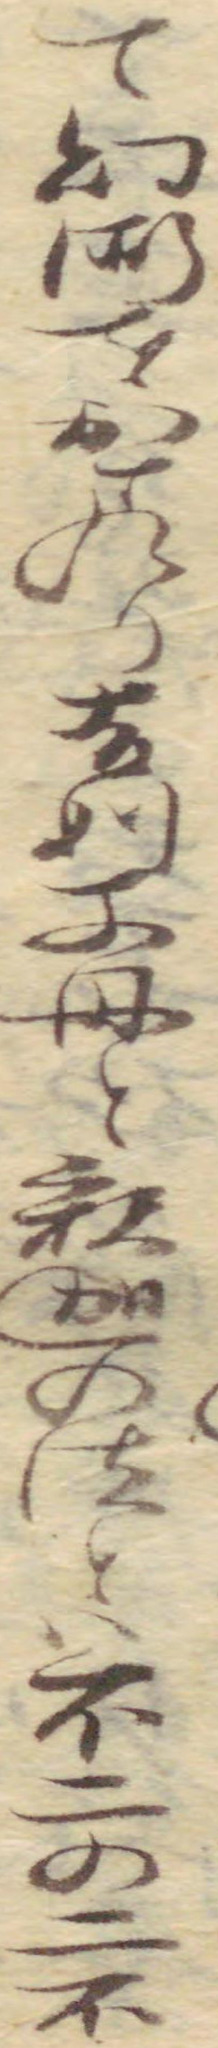て妖術をかされり吉利支丹と釈迦の法とは不二の二不
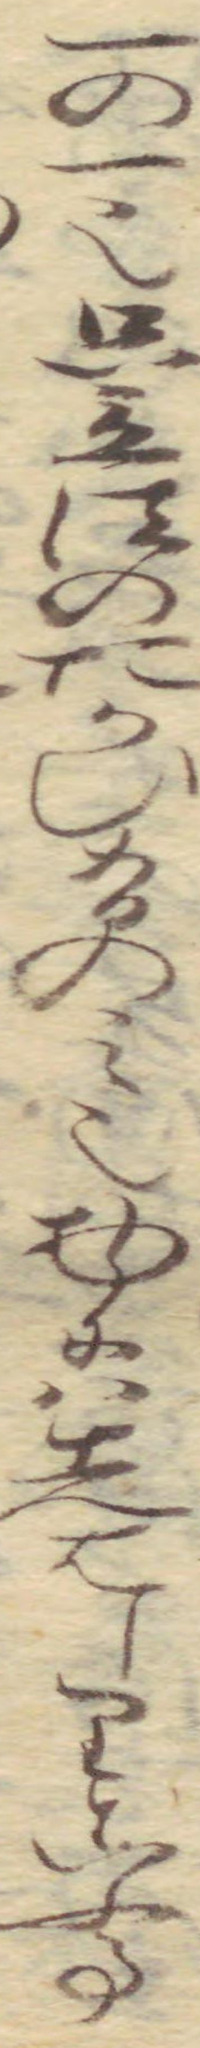一の一也只立法のたかひ有のみ也物には先はしりといふ事
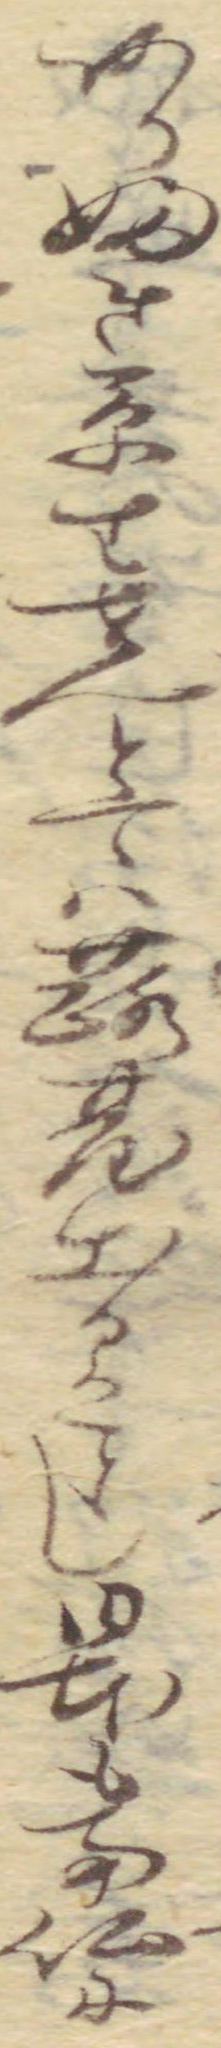ありふき草生せんとては蕗薹出るかことし日本も南仏に
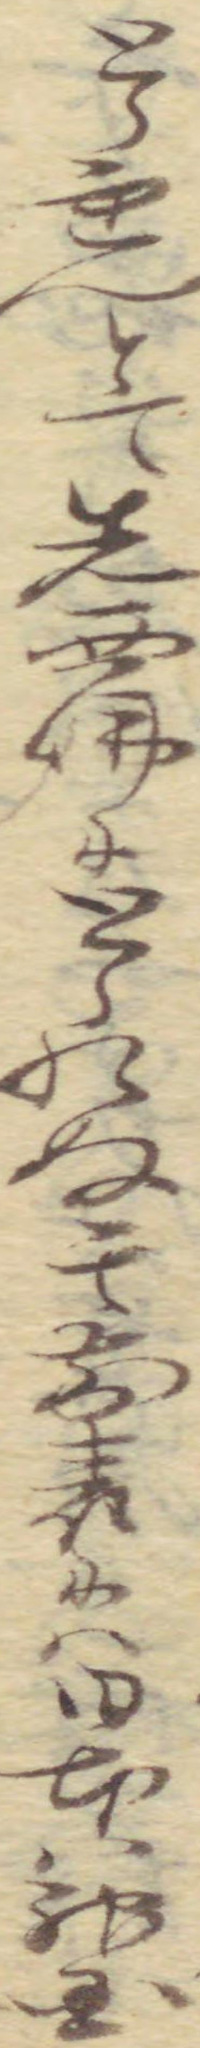とられんとて先西仏にとられぬ其前表には日本は神国
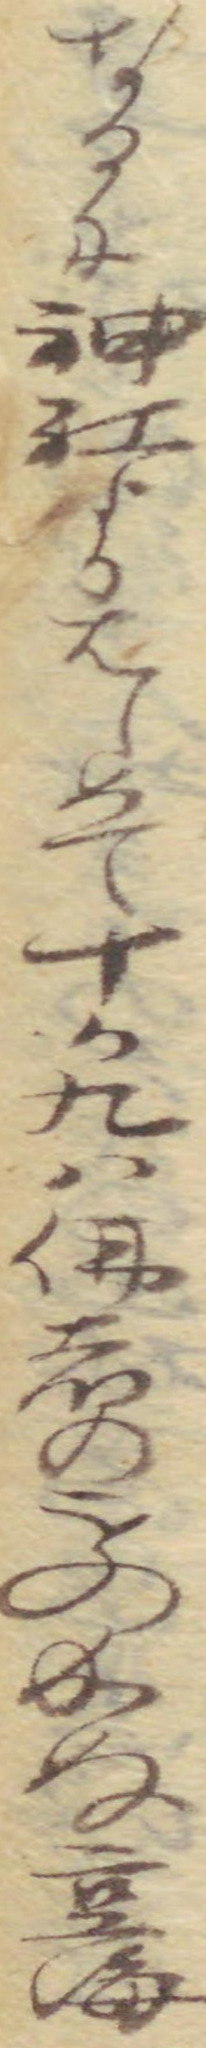なるに神社よりはしめて十か九は仏者のもの成ぬ空海
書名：鶯宿雑記. 巻263-264
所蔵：国立国会図書館 National Diet Library, JAPAN
